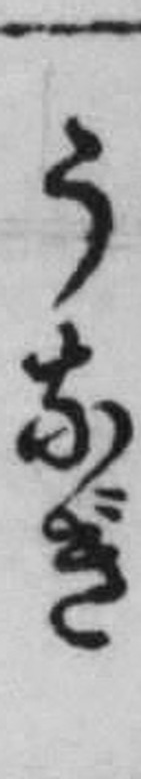うなぎ
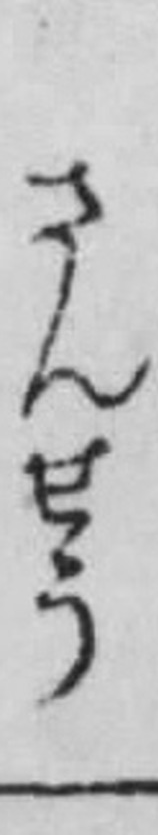さんせう
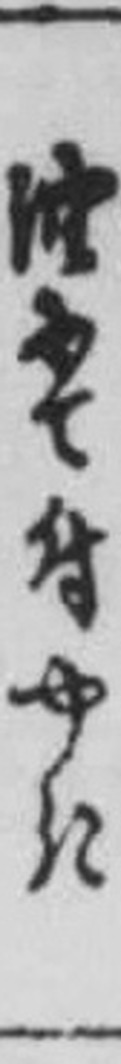油にて付やき
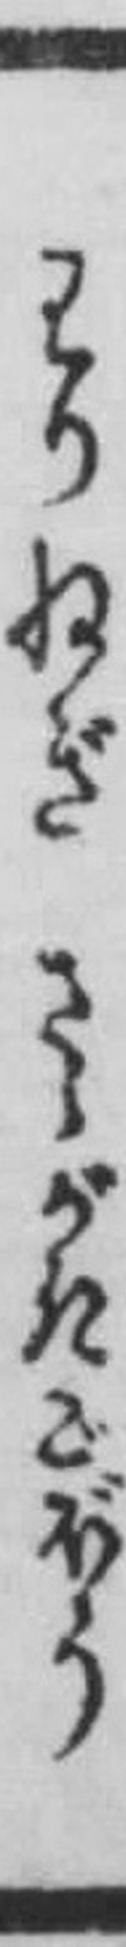わりねぎさゝがきごぼう
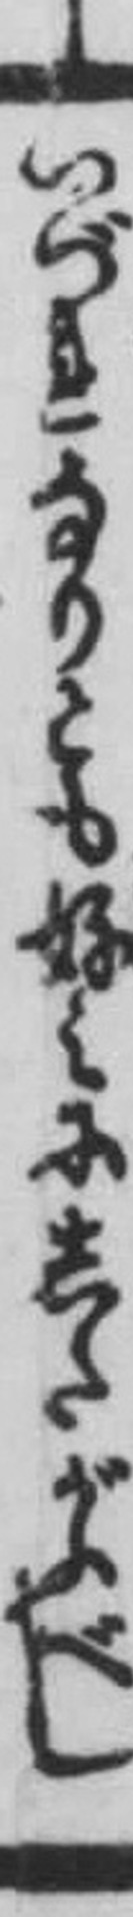いづれなりとも好みにしたがふべし
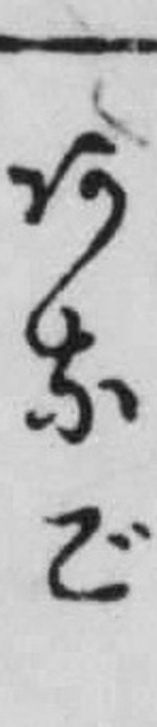あなご
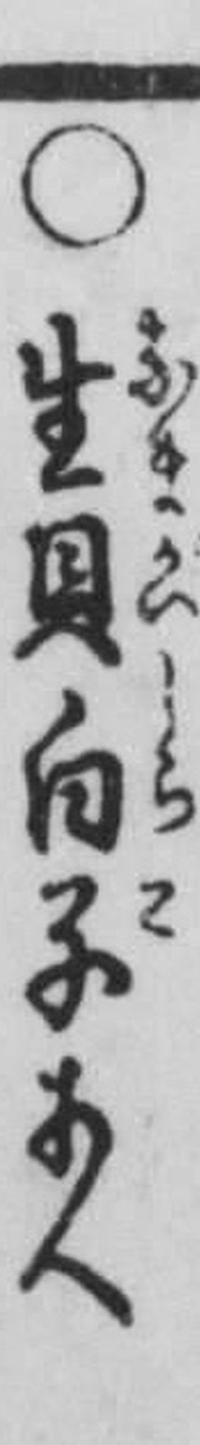〇生貝白子あへ
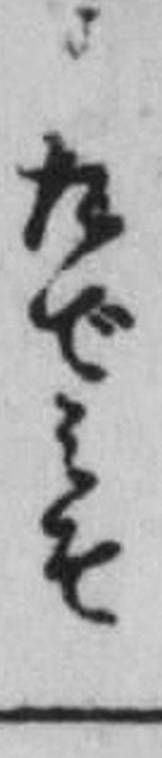たでみそ
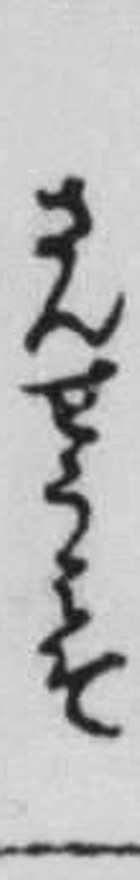さんせうみそ
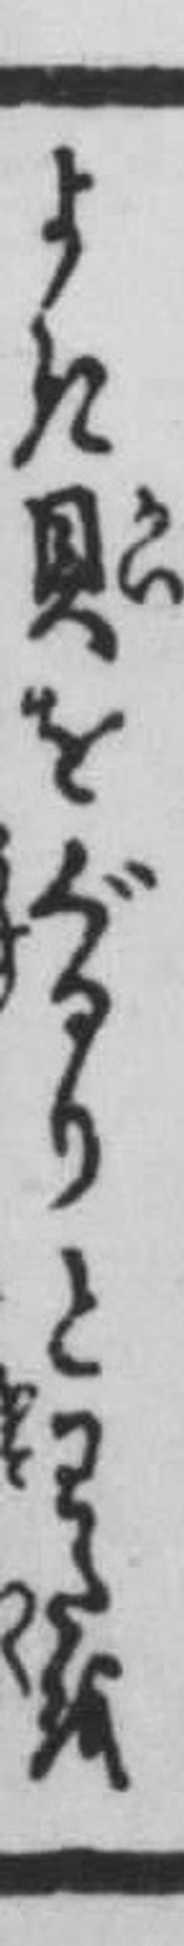よき貝をぐるりとわたを
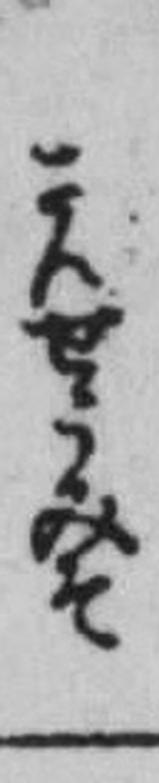さんせうみそ
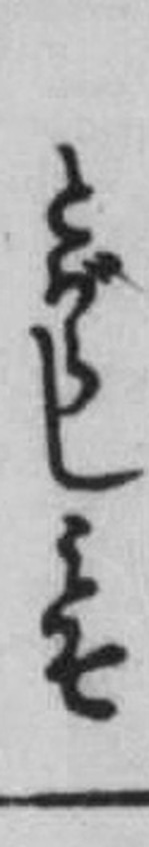とがらしみそ
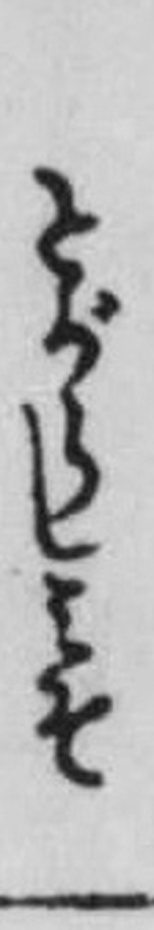とがらしみそ
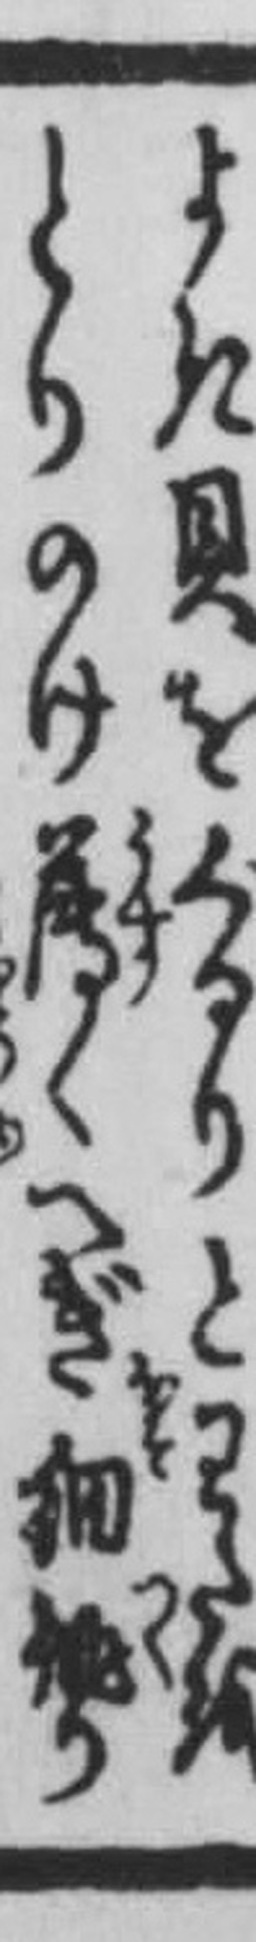とりのけ薄くへぎ細作り
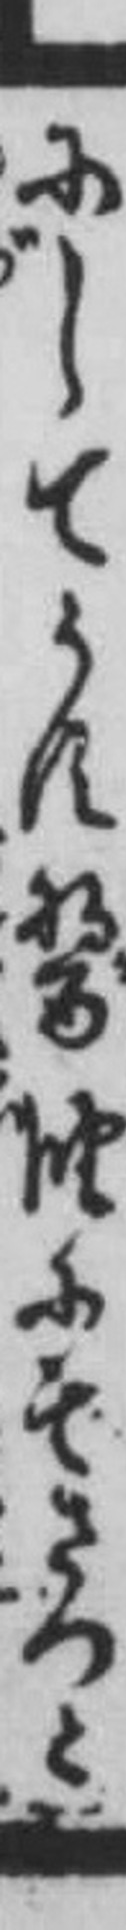にしてうす醬油にてさつと
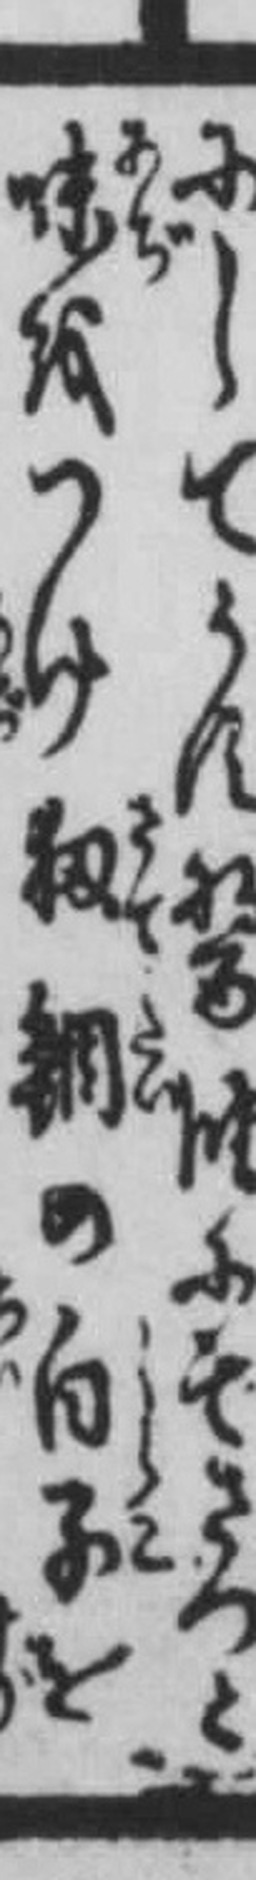味をつけ扨鯛の白子を
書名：日用重宝魚類精進/料理早工風
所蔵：大阪府立大学学術情報センター 国文学研究資料館
